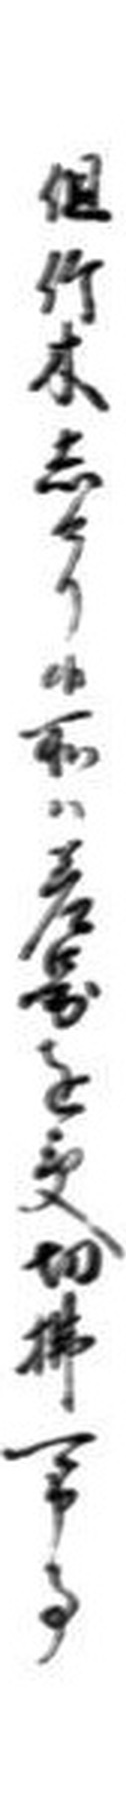但竹木しけり候所ハ差図を受切払可申事
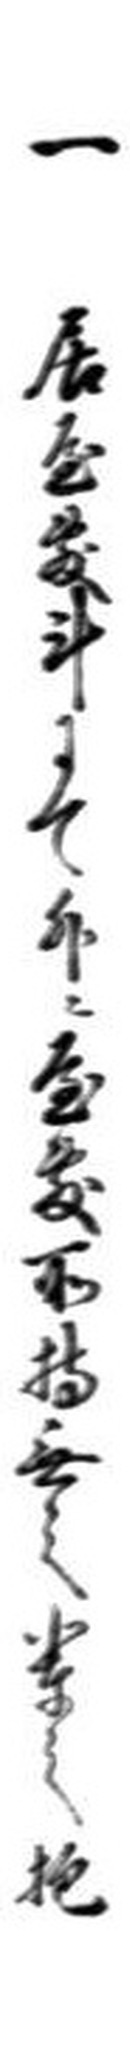一居屋敷斗にて外ニ屋敷所持無之輩之抱
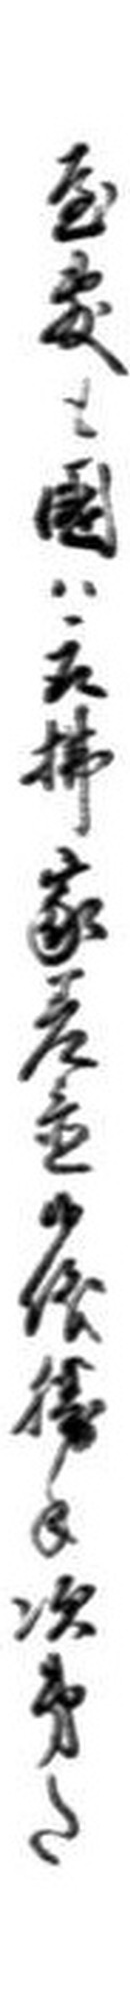屋敷も囲ハ取払家差置候儀勝手次第た
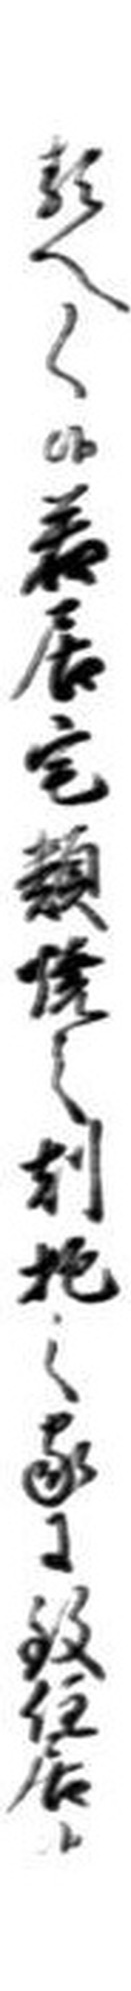るへく候若居宅類焼之刻抱之家に致住居候
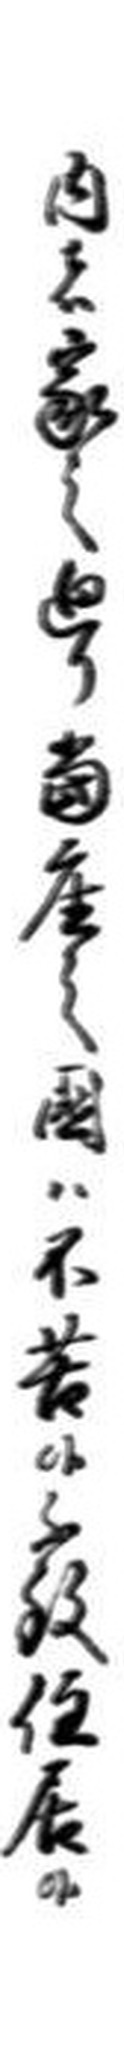内者家之廻り当座之囲ハ不苦候不致住居候
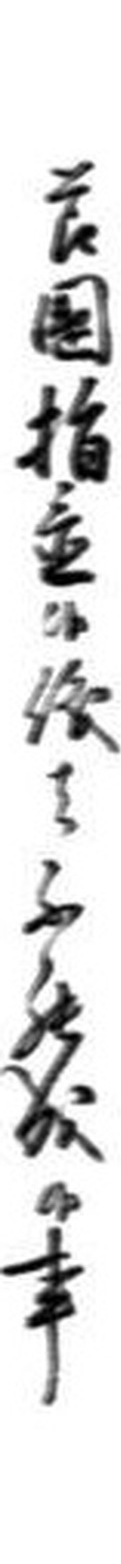節囲指置候儀者不罷成候事

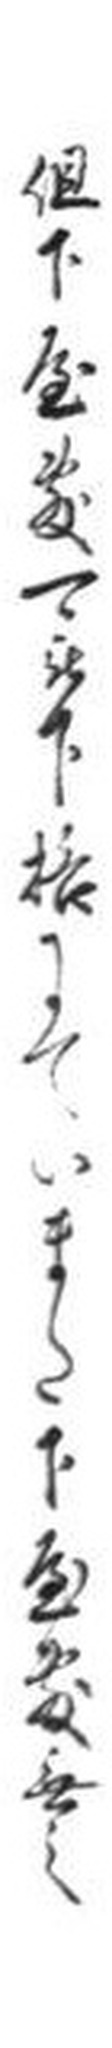但下屋敷可被下格にていまた下屋敷無之
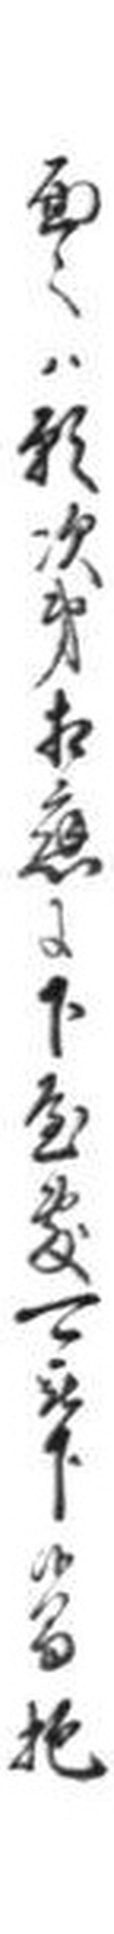面々ハ願次第相応に下屋敷可被下候間抱
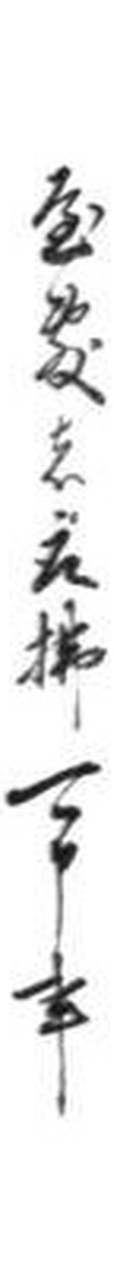屋敷者取払可申事
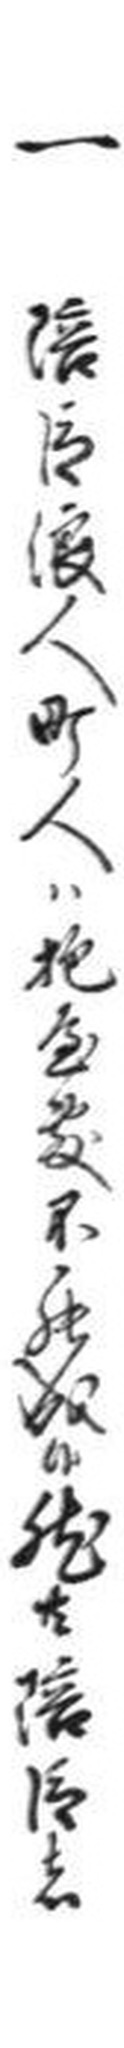一陪臣浪人町人ハ抱屋敷不罷成候然共陪臣者
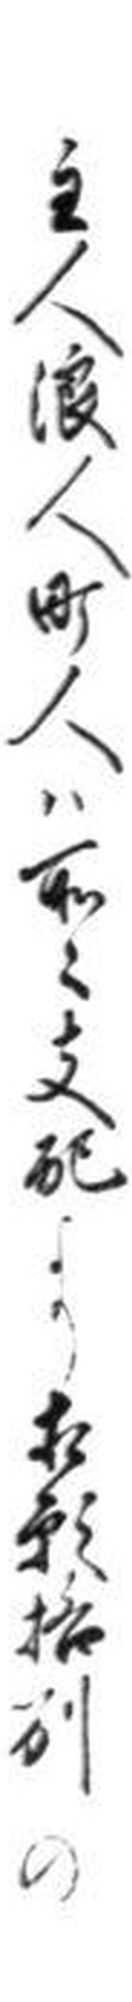主人浪人町人ハ所々支配より相願格別の
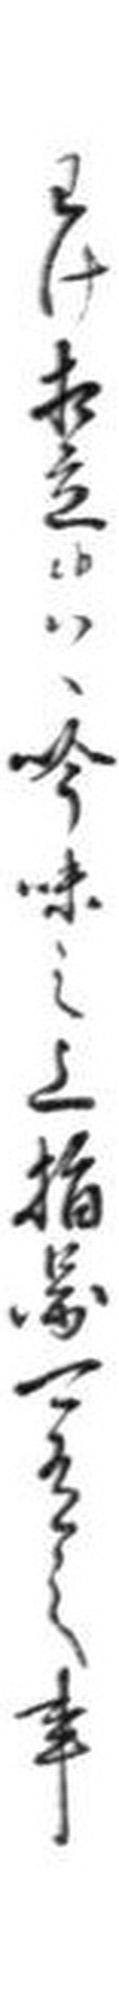わけ相立候ハヽ吟味之上指図可有之事
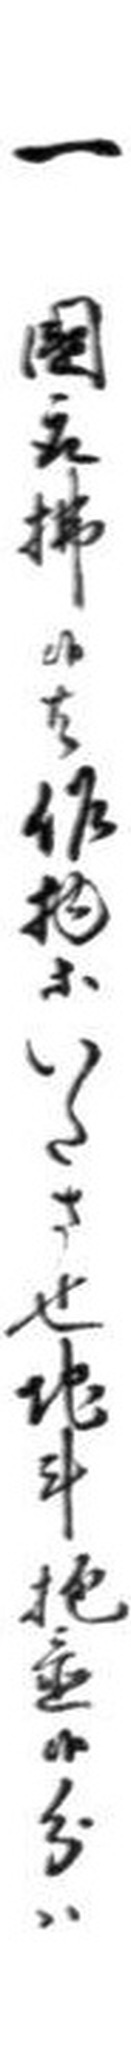一囲取払候共作物等いたさせ地斗抱置候分ハ
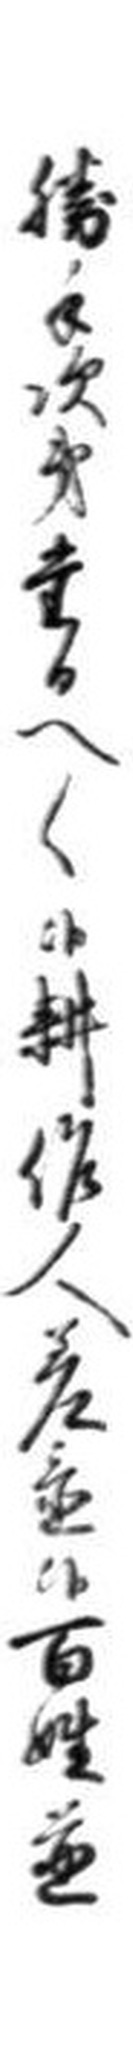勝手次第たるへく候耕作人差置候百姓並
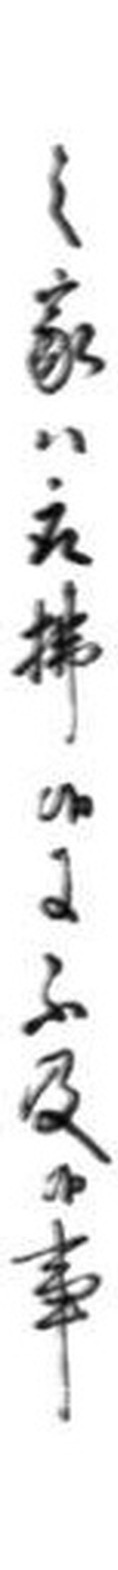之家ハ取払候に不及候事
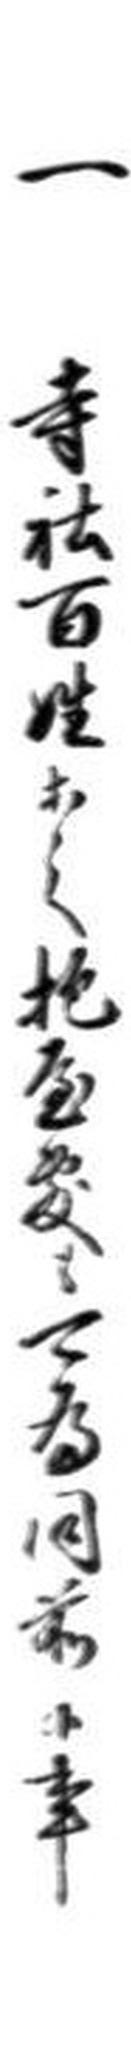一寺社百姓等之抱屋敷も可為同前候事
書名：家譜 三十二 吉邦公 従享保二年到享保三年
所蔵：福井県文書館 Fukui Prefectural Archives
